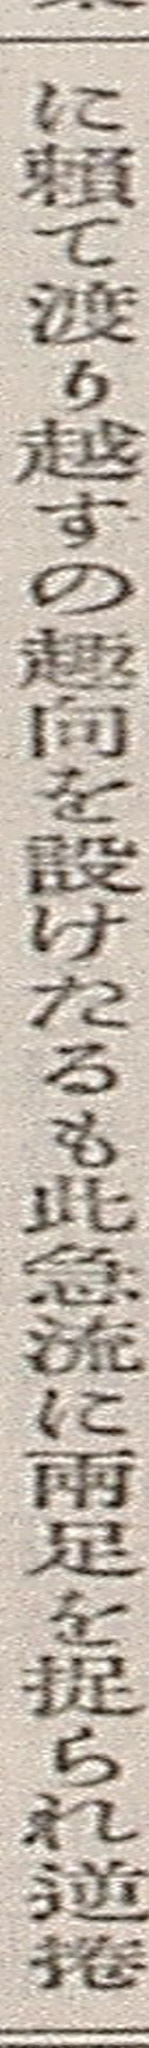に頼て渡り越すの趣向を設けたるも此急流に両足を捉られ逆捲
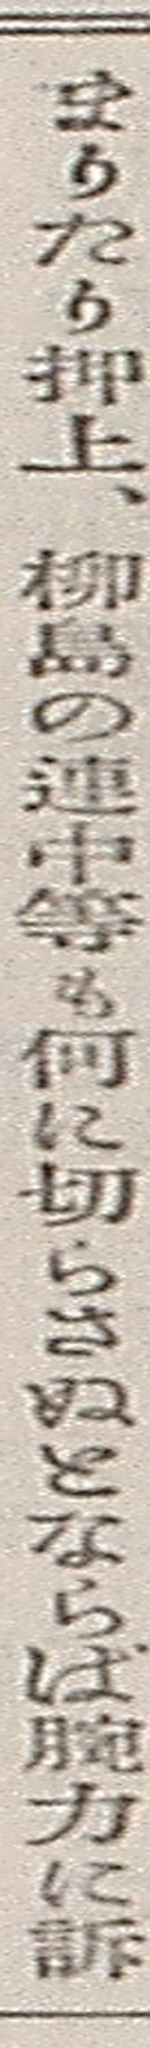まりたり押上、柳島の連中等も何に切らさぬとならば腕力に訴
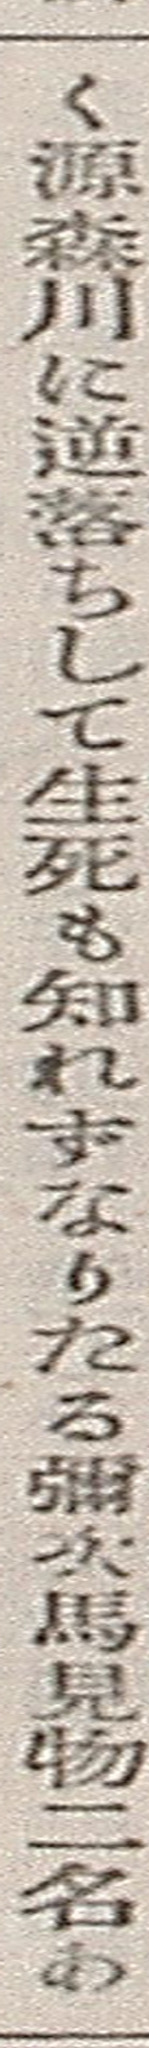く源森川に逆落ちして生死も知れずなりたる弥次馬見物二名あ
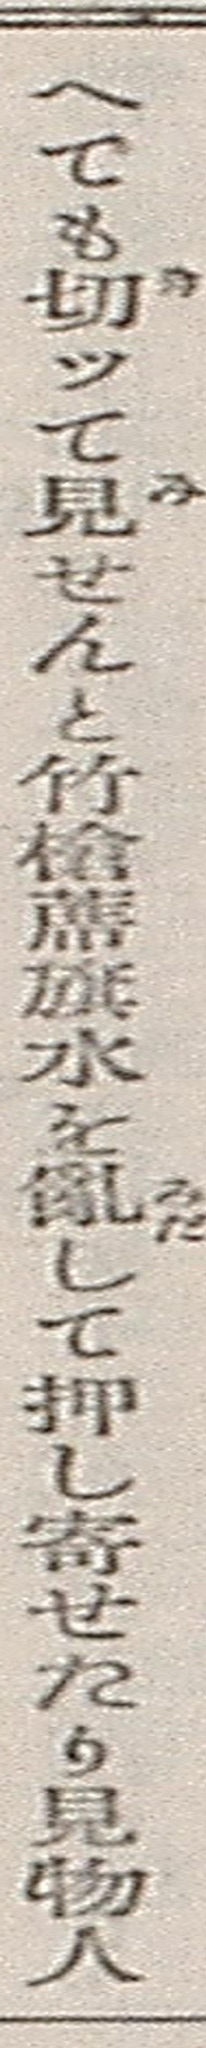へても切ツて見せんと竹槍蓆旗水を乱して押し寄せたり見物人
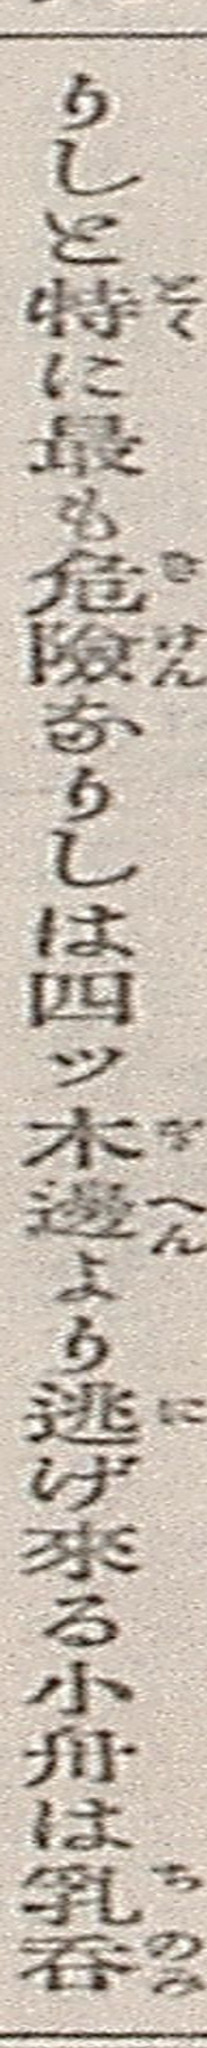りしと特に最も危険なりしは四ツ木辺より逃げ来る小舟は乳呑
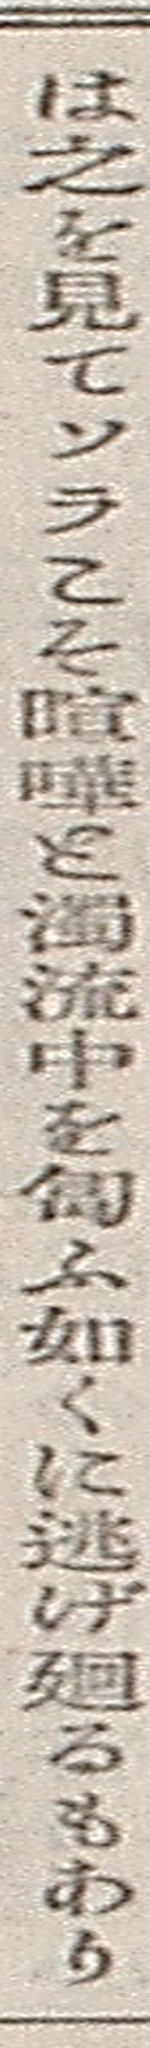か之を見てソラこそ喧嘩と濁流中を匍ふ如くに逃げ廻るもあり
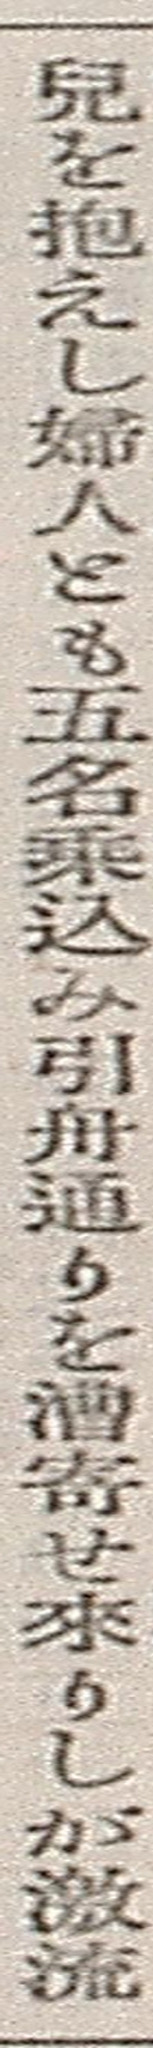児を抱えし婦人とも五名乗込み引舟通りを漕寄せ来りしが激流
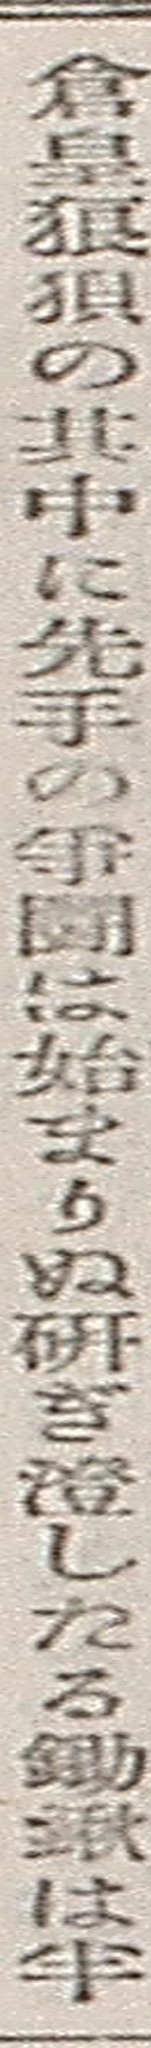倉皇狼狽の其中に先手の争闘は始まりぬ研ぎ澄したる鋤鍬は半
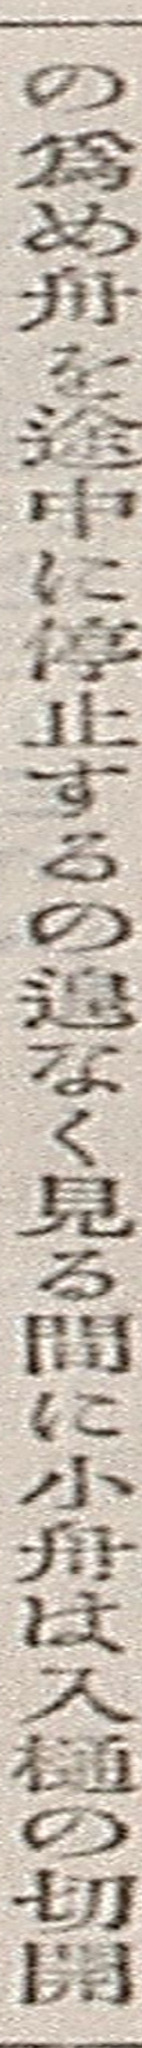の為め舟を途中に停止するの遑なく見る間に小舟は入樋の切開
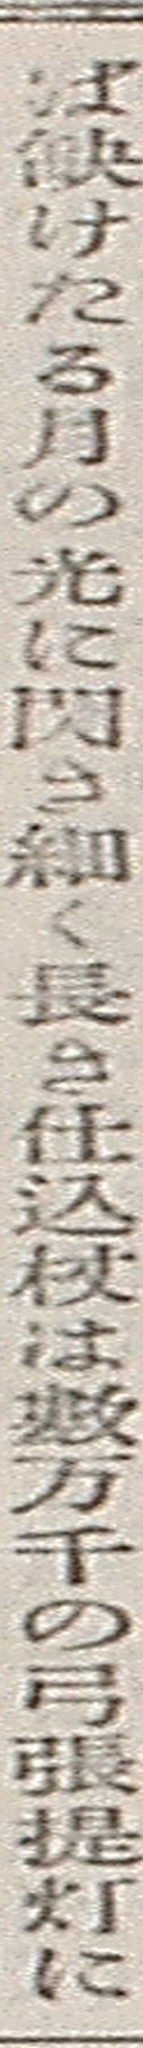ば欠けたる月の光に閃き細く長き仕込杖は数万千の弓張提灯に
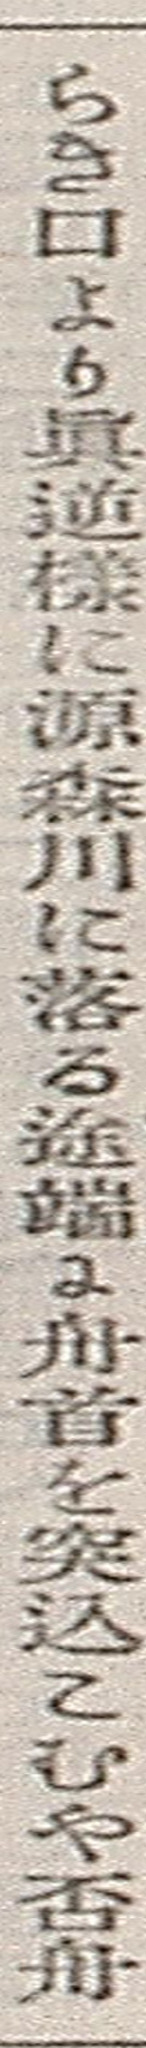らき口より真逆様に源森川に落る途端に舟首を突込こむや否舟
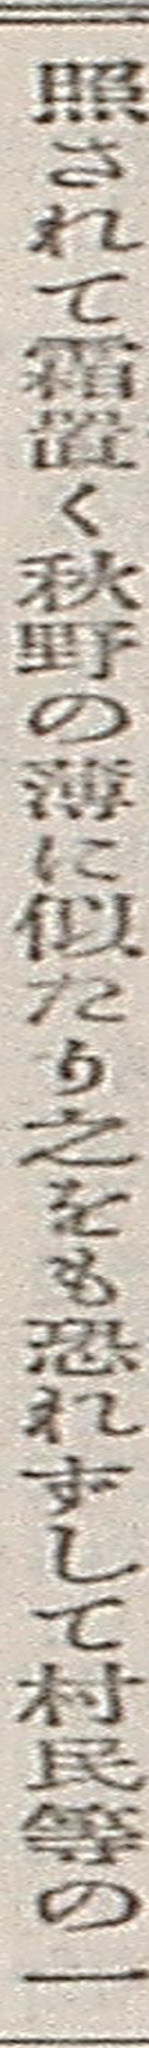照されて霜置く秋野の薄に似たり之をも恐れずして村民等の一
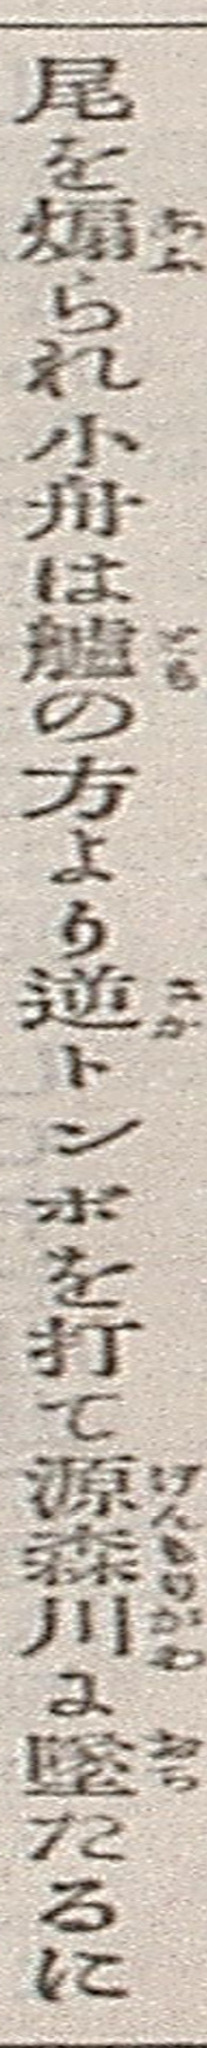尾を煽られ小舟は艫の方より逆トンボを打て源森川に墜たるに
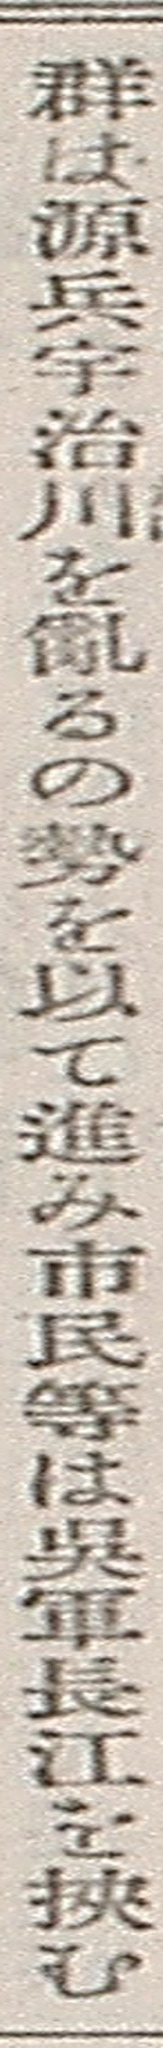群は源兵宇治川を乱るの勢を以て進み市民等は呉軍長江を挟む
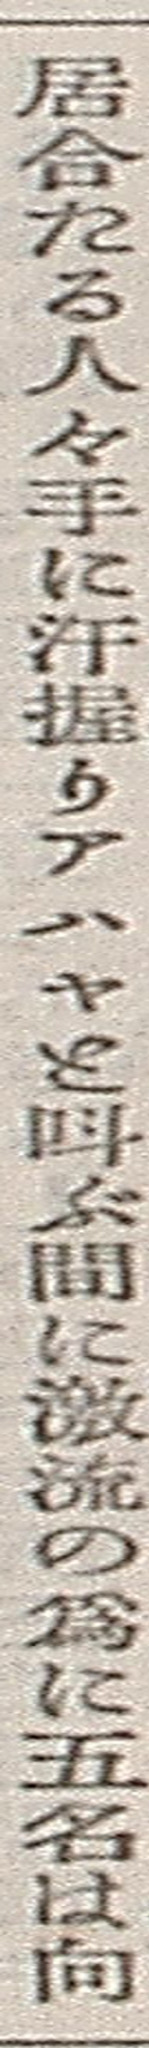居合たる人々手に汗握りアハヤと叫ぶ間に激流の為に五名は向
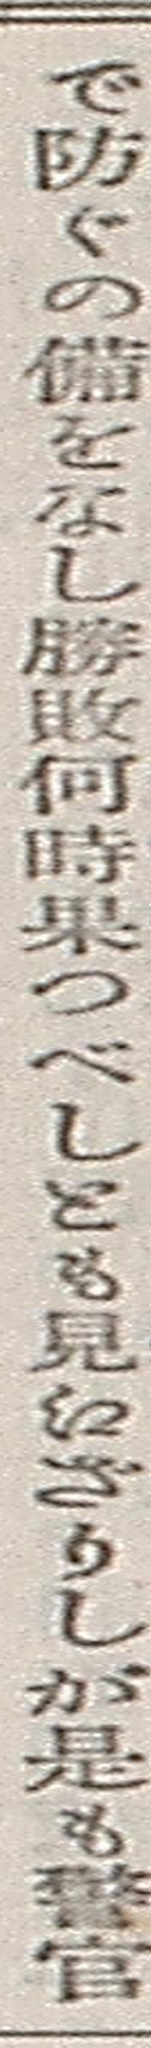で防ぐの備をなし勝敗何時果つべしとも見えざりしが是も警官
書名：風俗畫報臨時増刊第百二十四號　洪水地震被害録（上）
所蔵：東京大学地震研究所図書室 Earthquake Research Institute Library, The University of Tokyo, JAPAN
